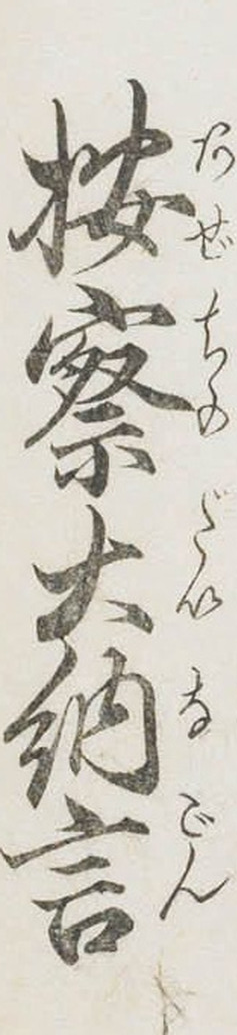按察大納言
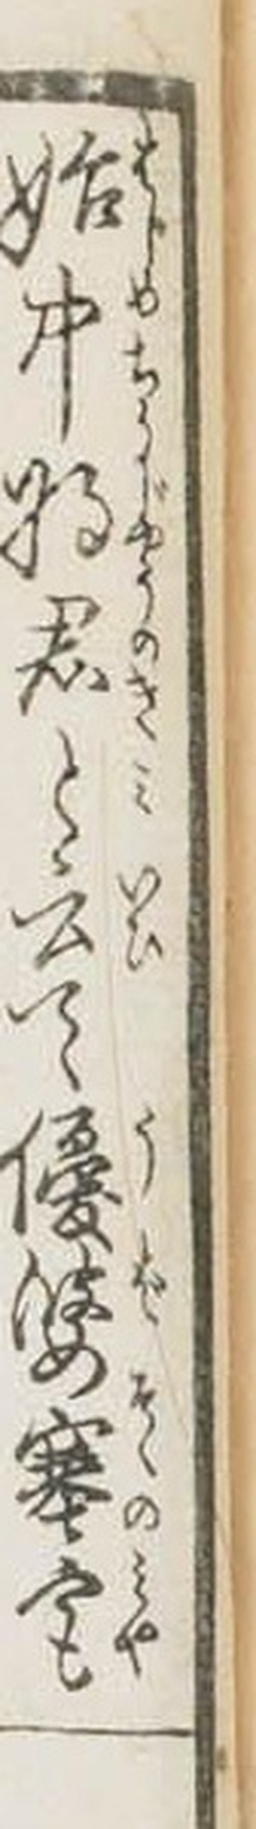始中将君と云て優婆塞宮
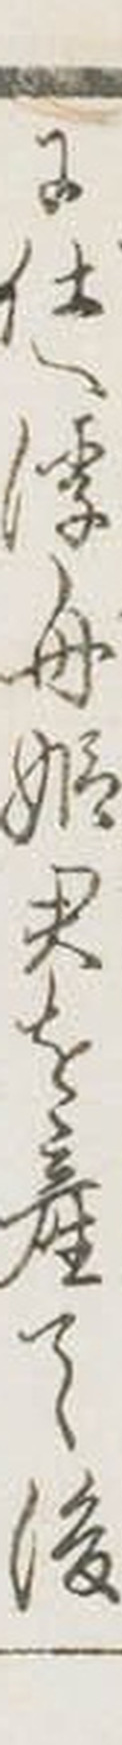に仕へ浮舟姫君を産て後
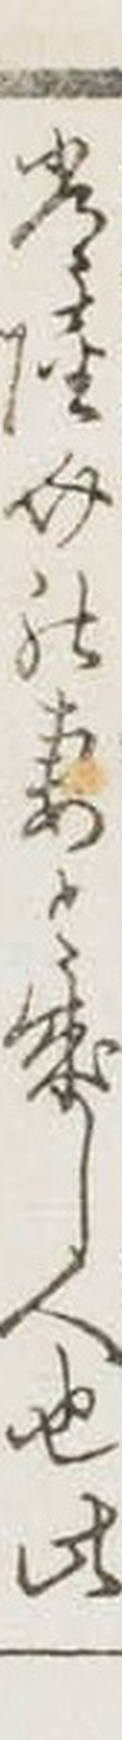常陸介の妻と成し人也此
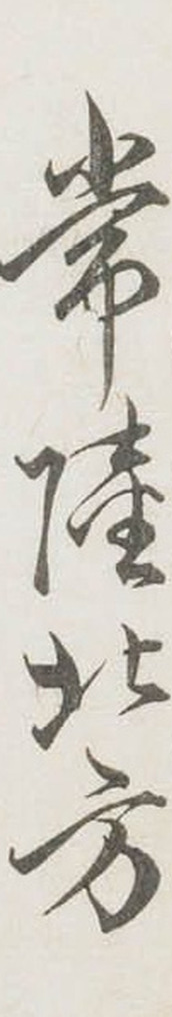常陸北方
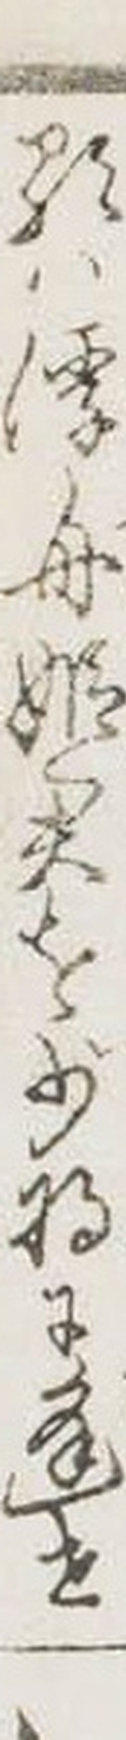歌は浮舟姫君を少将に逢せ
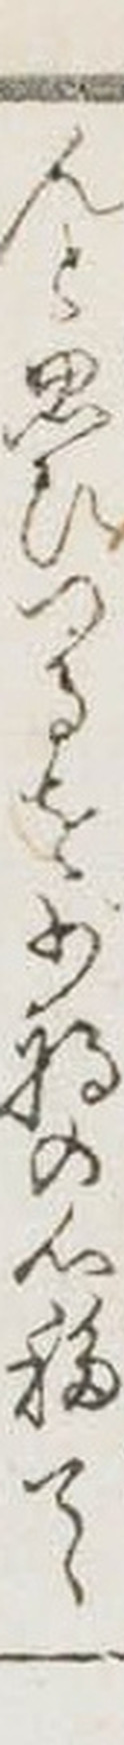んと思ひつるを少将の心移て
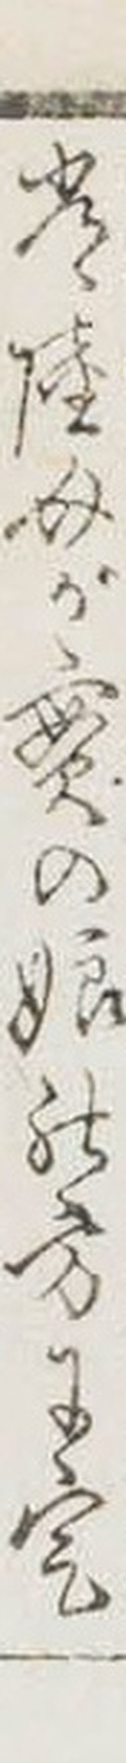常陸介が実の娘の方に定
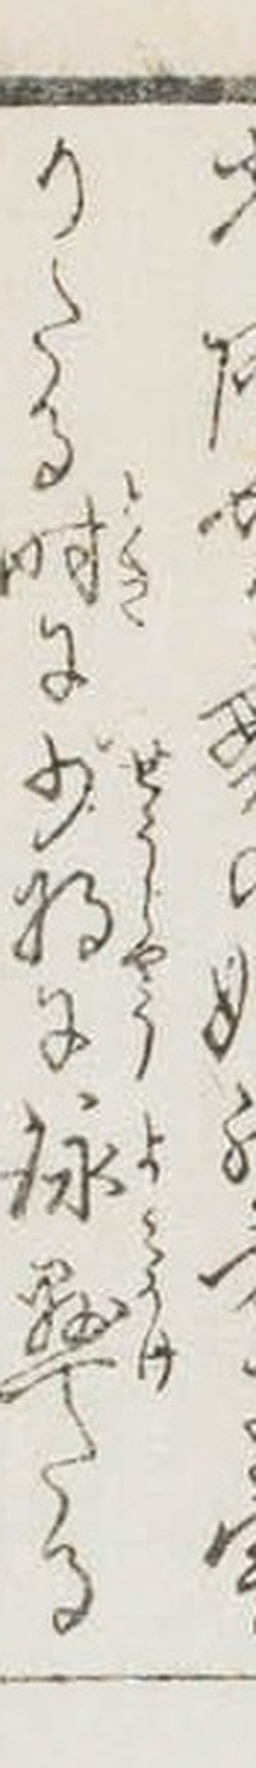りたる時に少将に詠懸たる
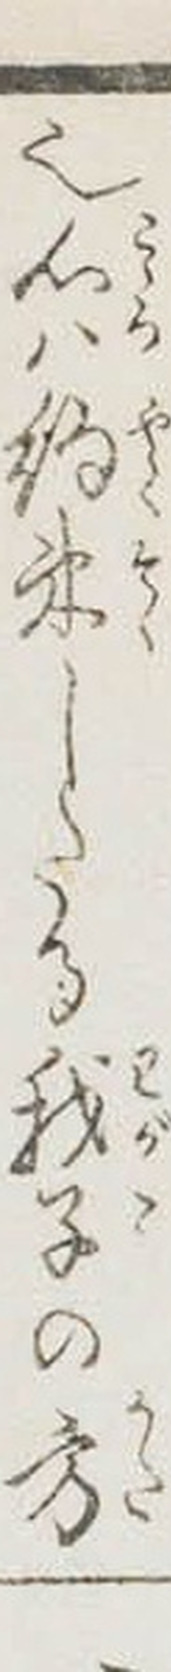也心は約束したる我子の方
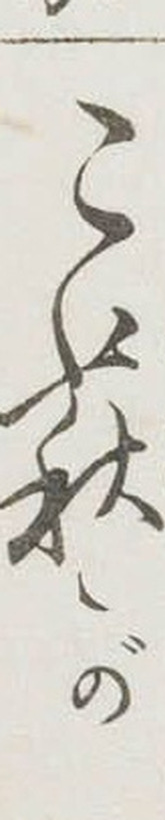こ萩が
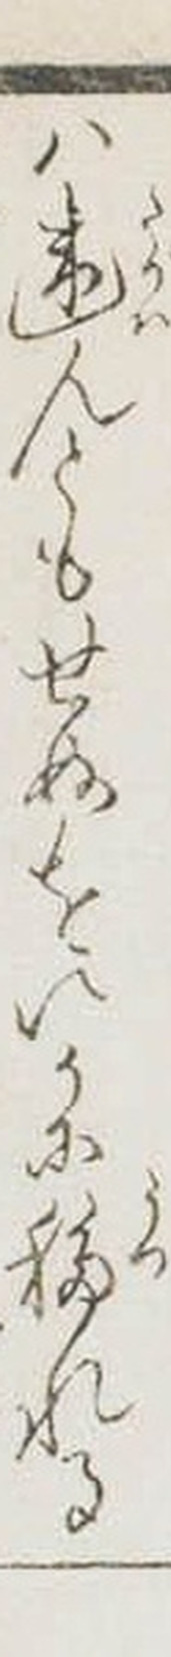は違んともせぬをいかに移れる
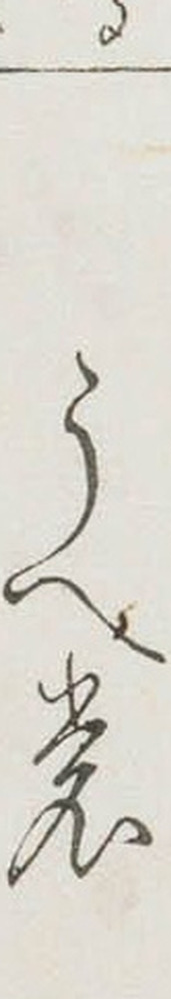うへも
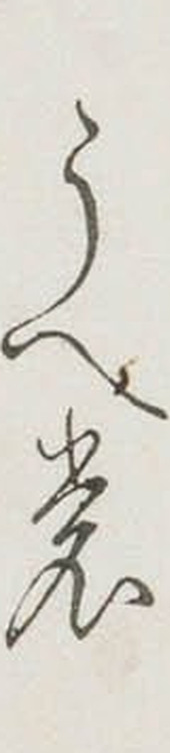うへも
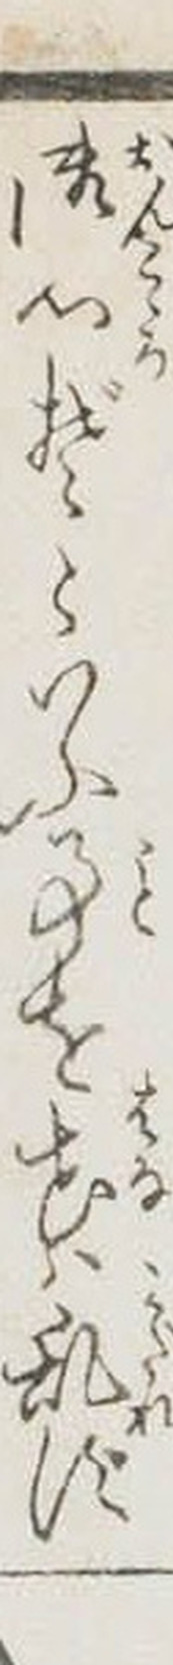御心ぞといふ事を花は乱ず
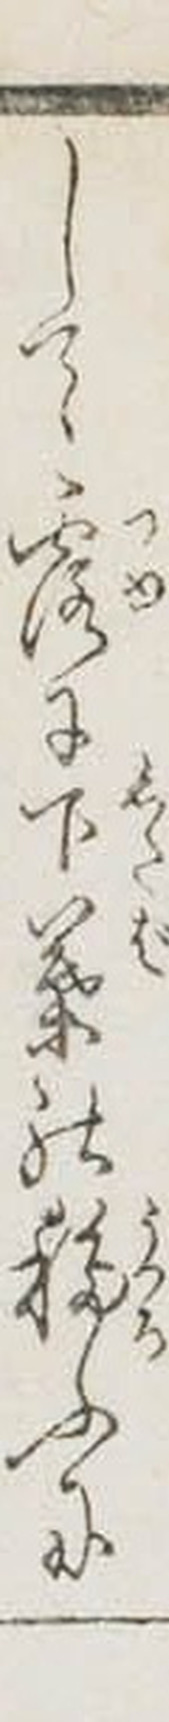して露に下葉の移ふに
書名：源氏百人一首
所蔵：東京学芸大学教育コンテンツアーカイブ
